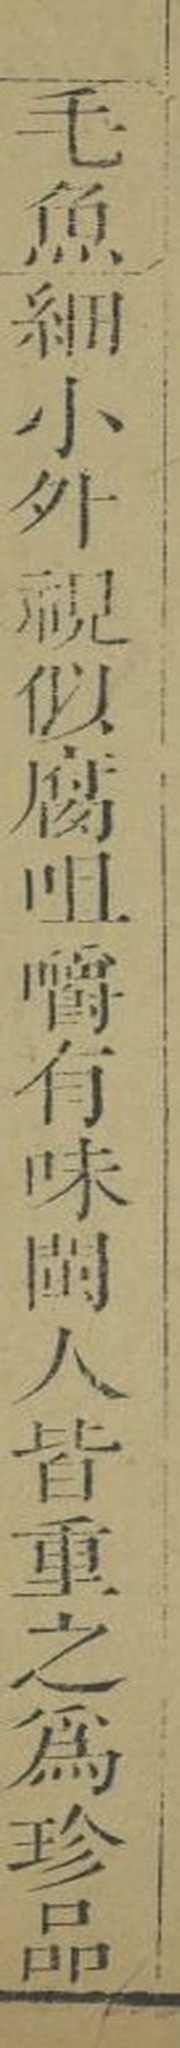[毛魚]細小外視似腐咀嚼有味閩人皆重之為珍品
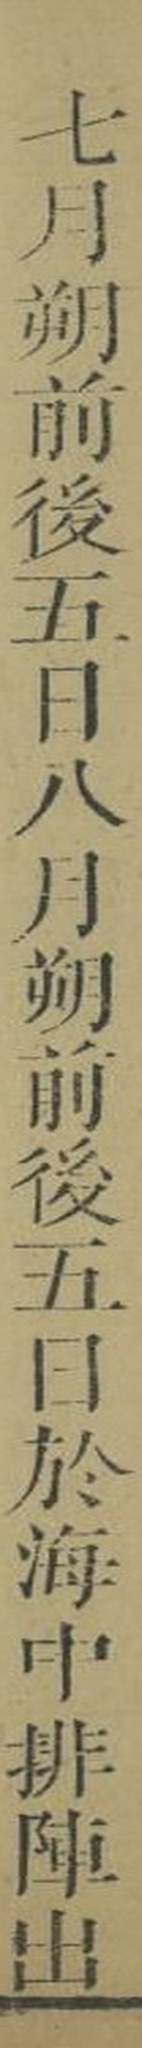七月朔前後五日八月朔前後五日於海中排陣出
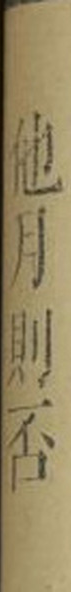他月則否
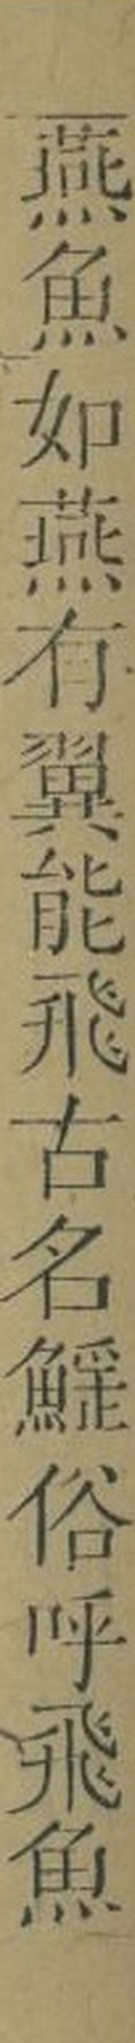[燕魚]如燕有翼能飛古名鳐俗呼飛魚
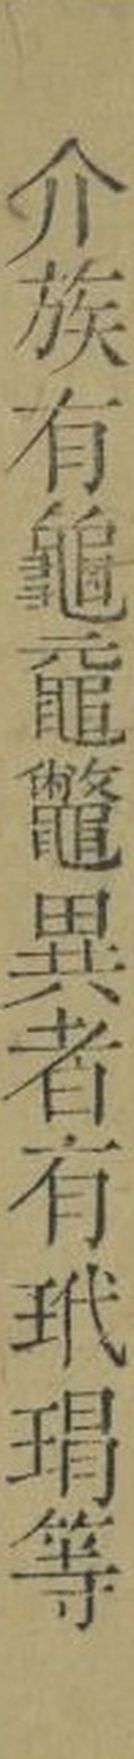介族有亀黿鼈異者有玳瑁等
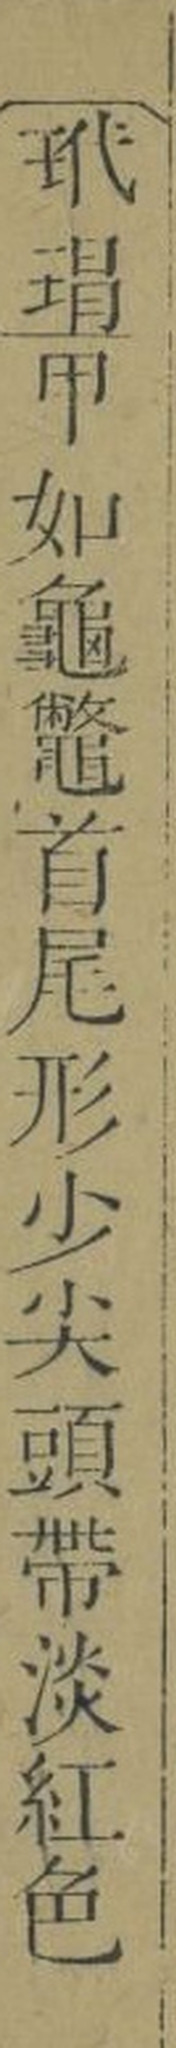[玳瑁]甲如亀鼈首尾形少尖頭帯淡紅色
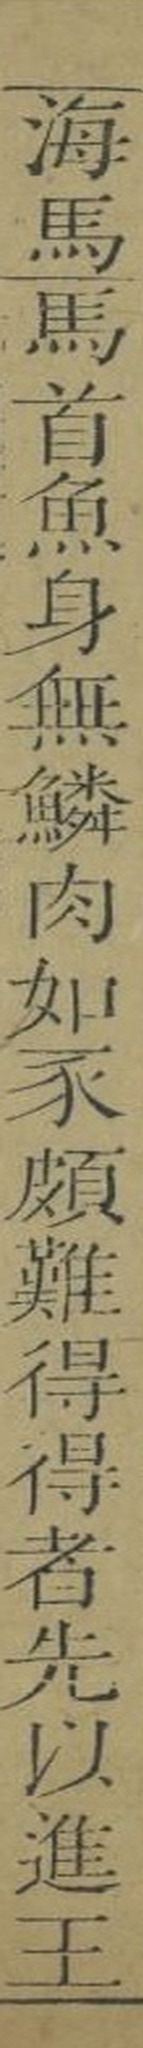[海馬]馬首魚身無鱗肉如豕頗難得得者先以進王
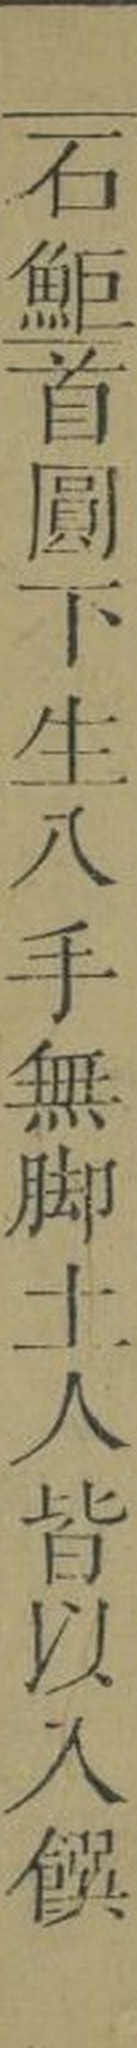[石鮔]首円下生八手無脚土人皆以入饌
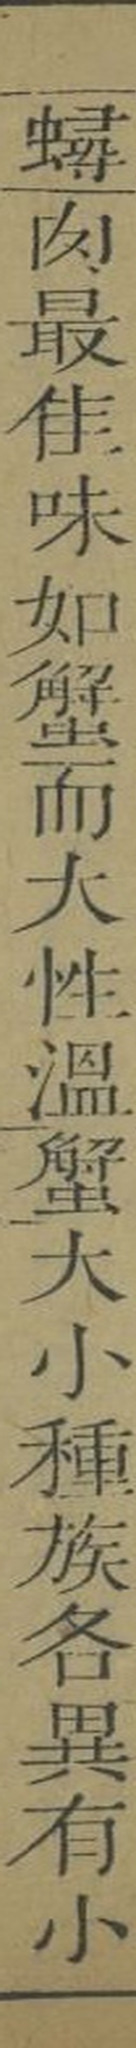[蟳]肉最佳味如蟹而大性温[蟹]大小種族各異有小
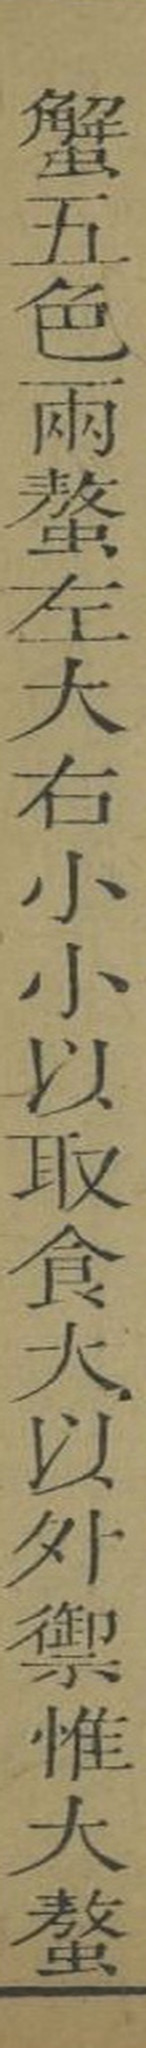蟹五色両螯左大右小小以取食大以外禦惟大螯
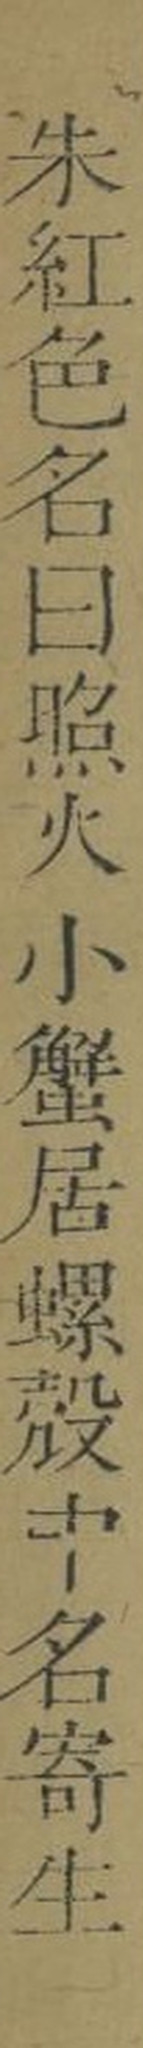朱紅色名曰照火小蟹居螺殻中名寄生

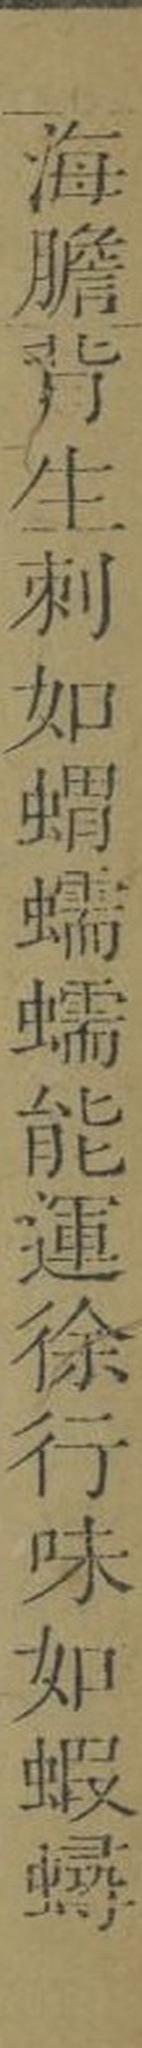[海胆]背生刺如蝟蠕蠕能運徐行味如蝦蟳
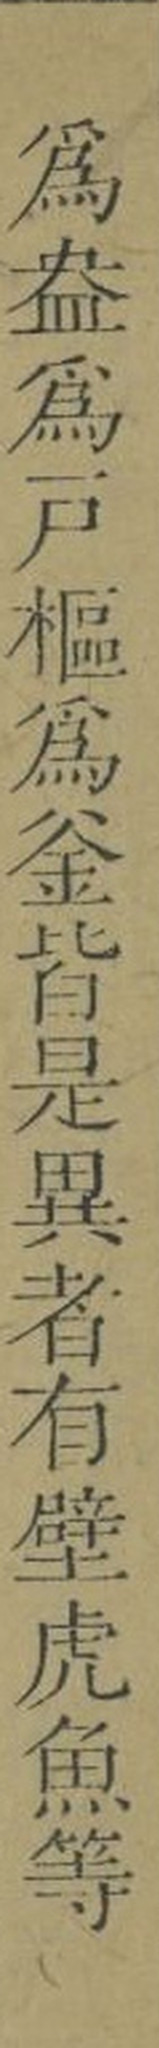為盎為戸枢為釜皆是異者有壁虎魚等
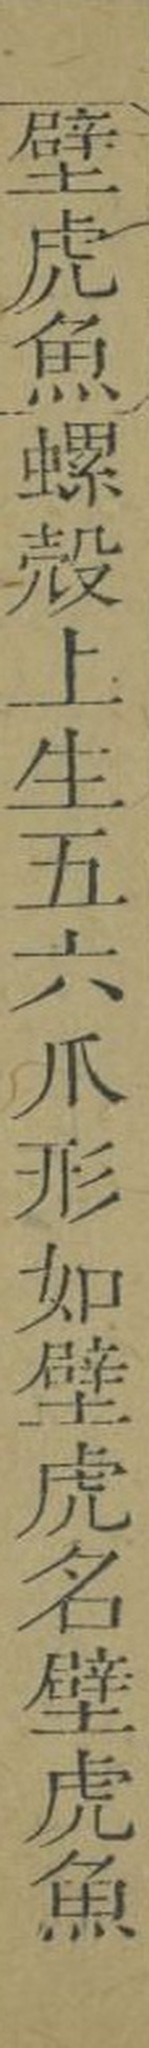[壁虎魚]螺殻上生五六爪形如壁虎名壁虎魚
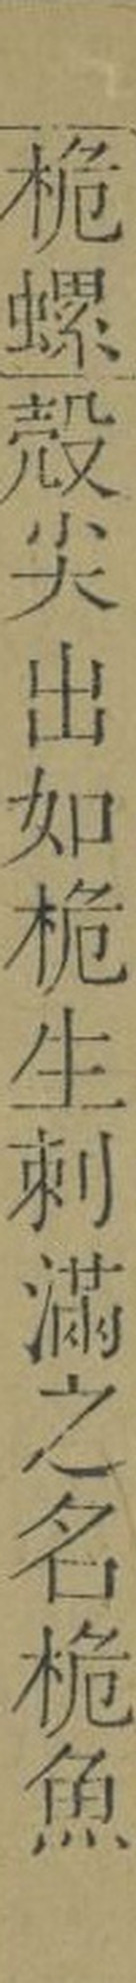[桅螺]殻尖出如桅生刺満之名桅魚
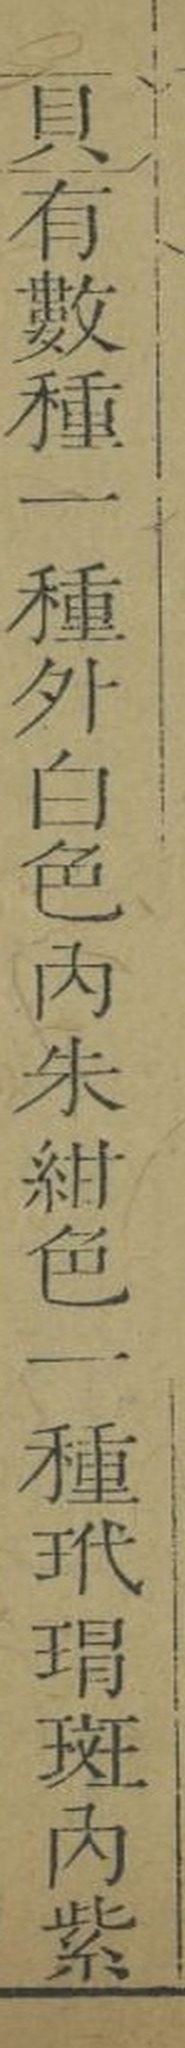[貝]有数種一種外白色内朱紺色一種玳瑁斑内紫
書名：中山伝信録 巻六
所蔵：University of the Ryukyus Library
